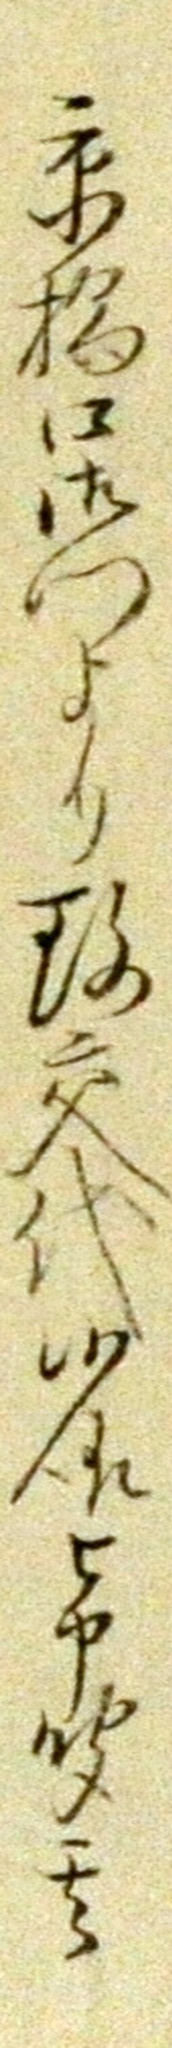京橋口御門より致交代候様被申聞其
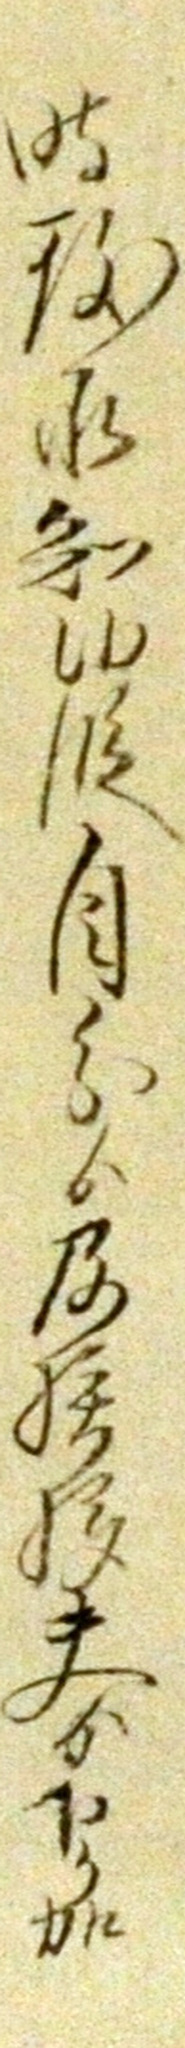時致承知候段自分ゟ及挨拶夫ゟ下り加
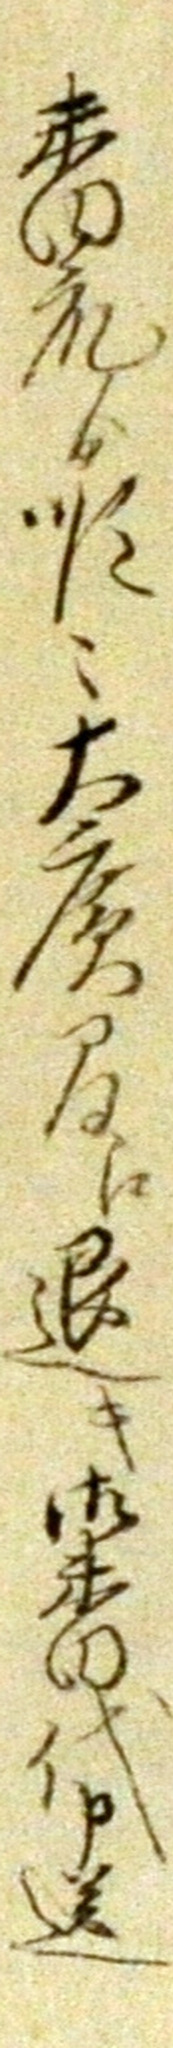番衆ゟ順々大広間え退キ御番代申送
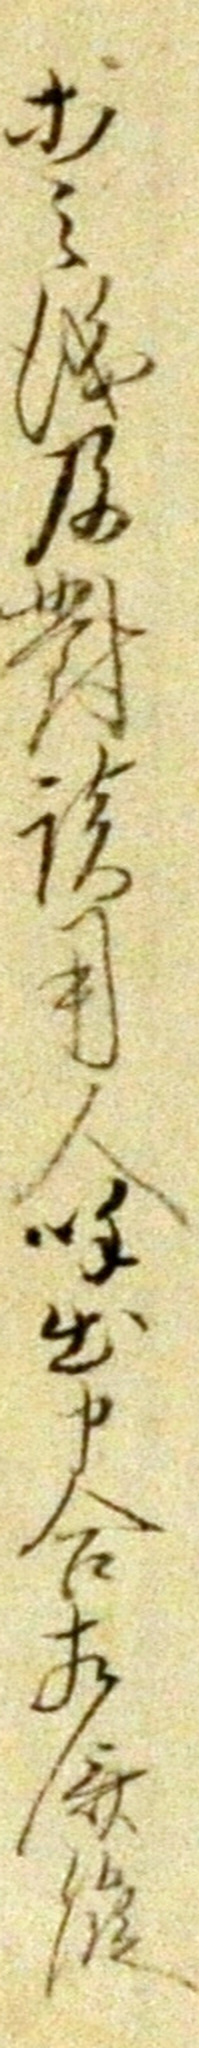等之儀及対談用人呼出申合相済候段
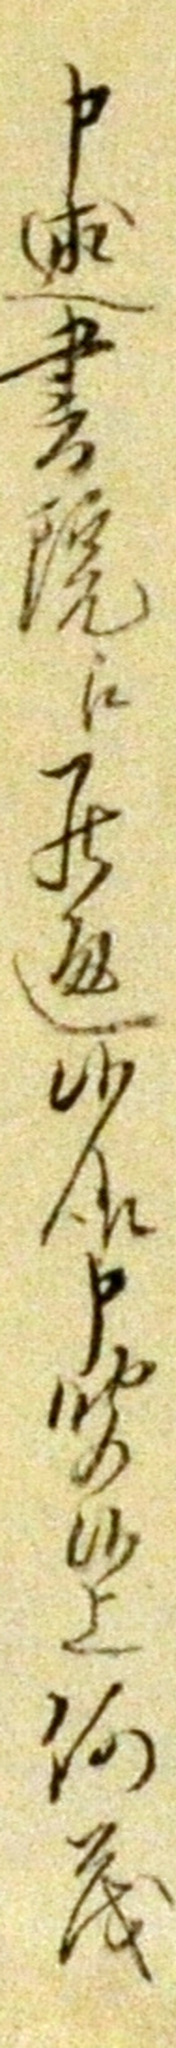申述書院え罷通候様申聞候上何も
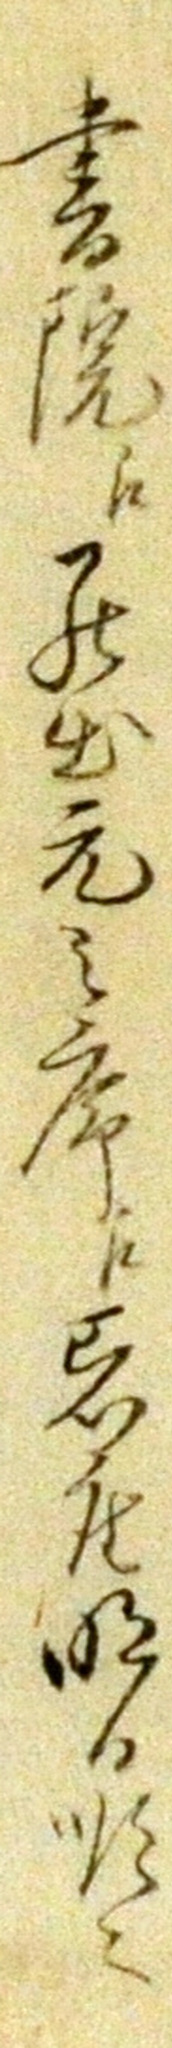書院え罷出元之席え着座明日順々
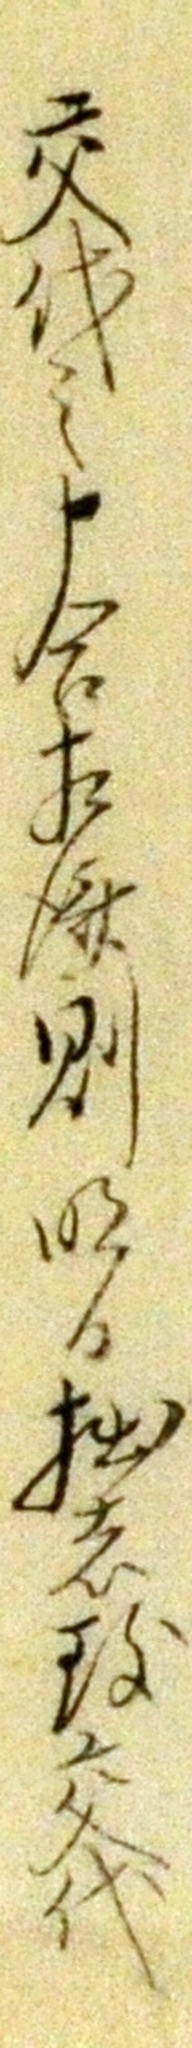交代之申合相済則明日拙者致交代
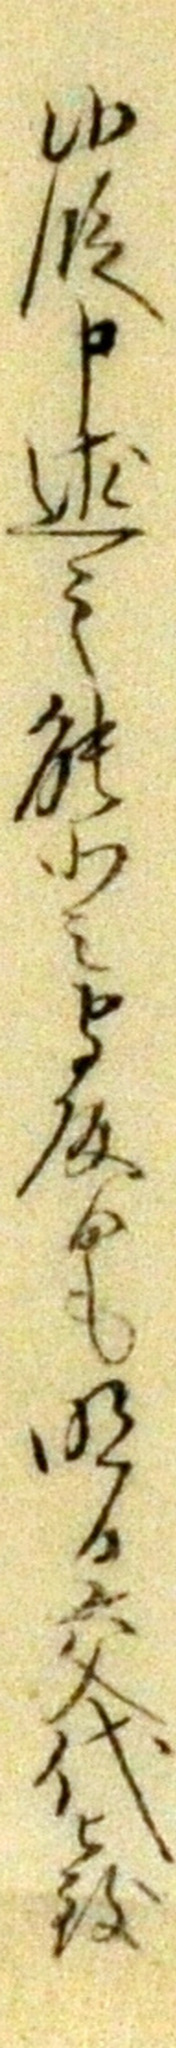候段申述之能登守殿ゟも明日交代被致
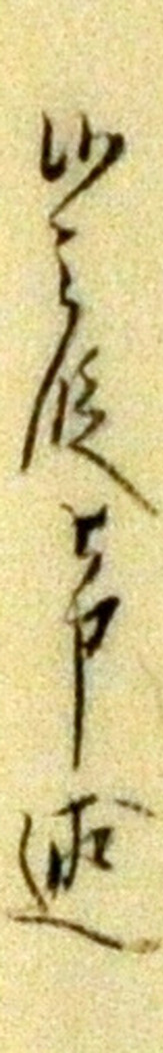候之段被申述
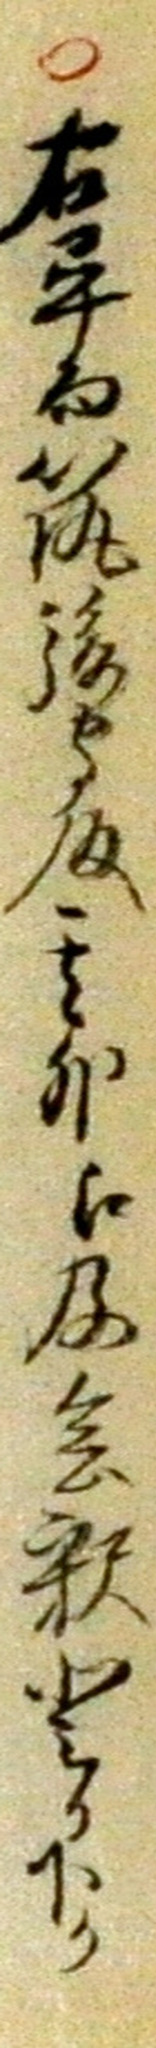右畢而筑後守殿其外え及会釈登り下り
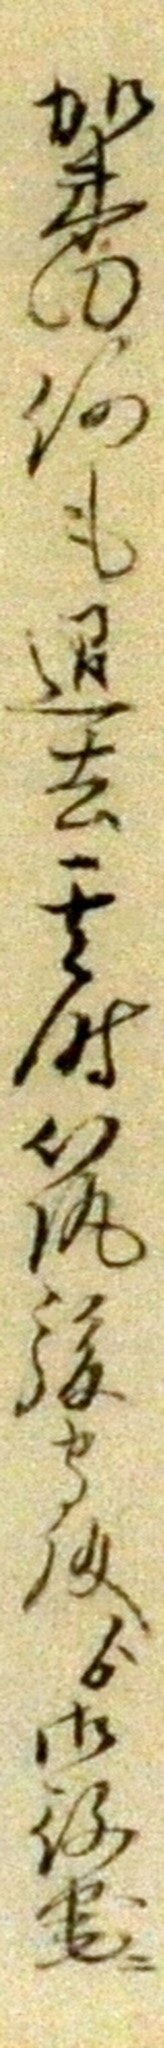加番何も退去其時筑後守殿ゟ御役宅ニ
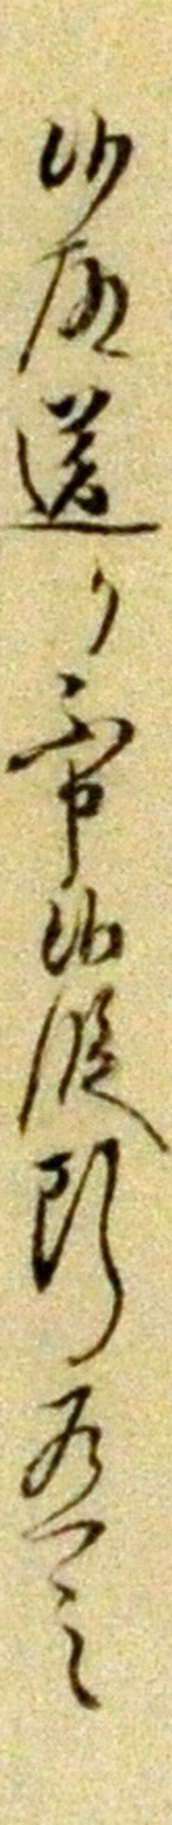候故送り不申候段断有之
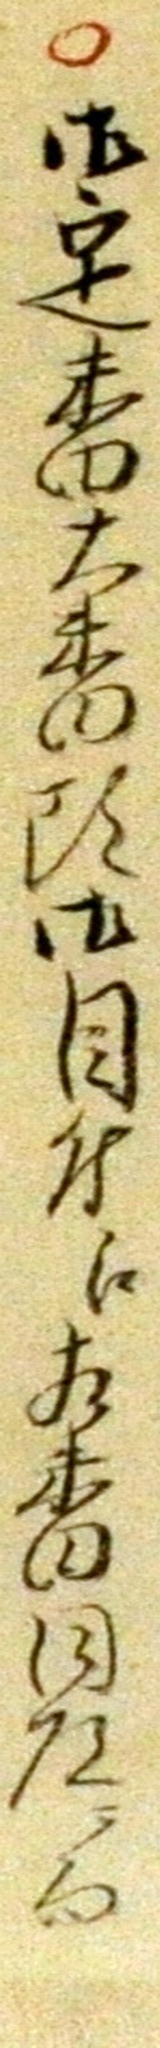御定番大番頭御目付え相番同道ニ而
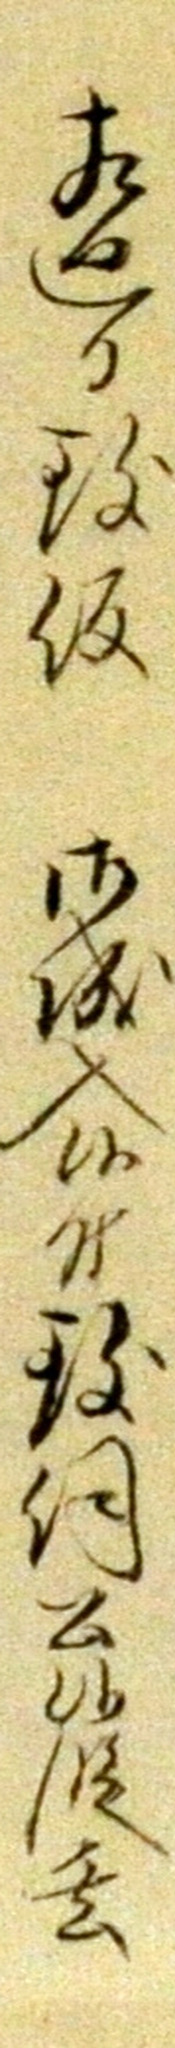相廻り致仮御城入候付致伺公候段玄
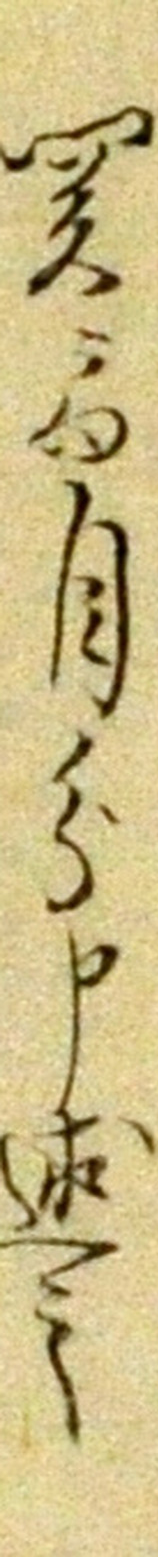関ニ而自分申述之
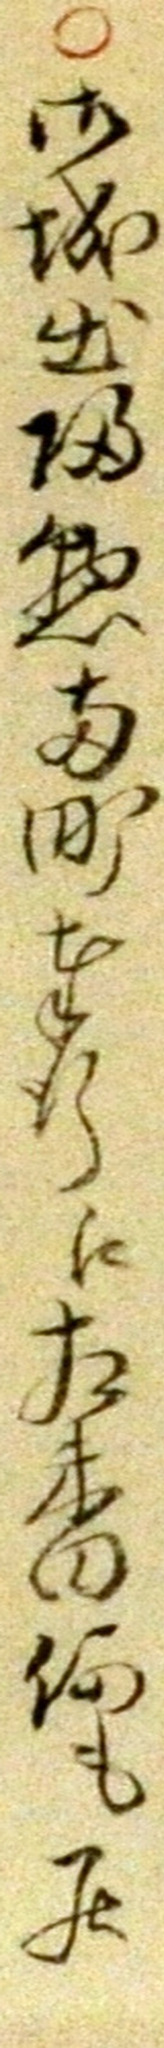御城出帰懸両町奉行え相番何も罷
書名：大阪加番関係諸書留〔一括〕
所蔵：伊那市立高遠町図書館・合同会社AMANE
